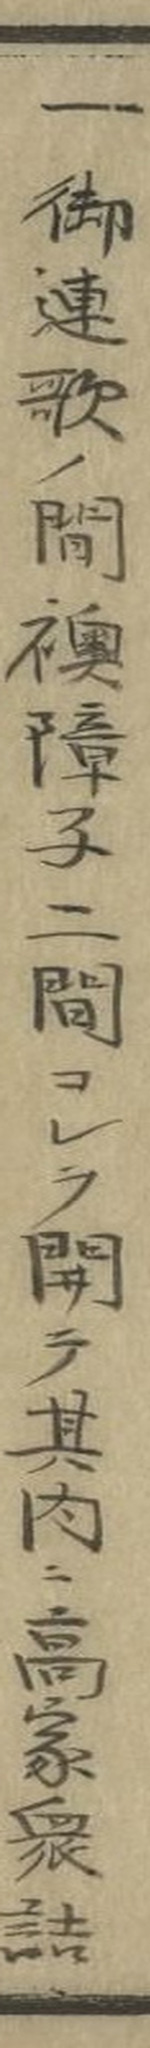一御連歌ノ間襖障子ニ間コレラ開テ其内ニ高家衆詰
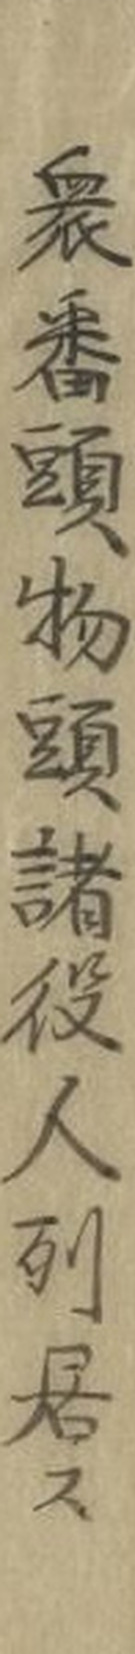衆番頭物頭諸役人列居ス
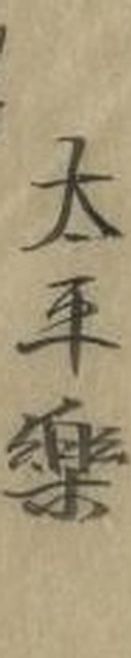太平楽

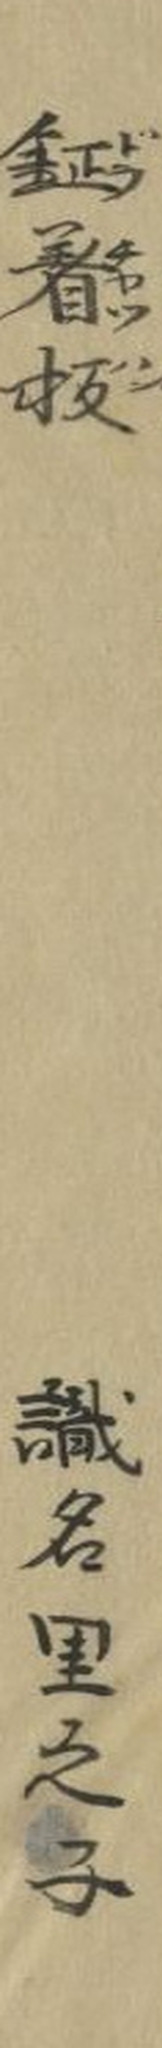鉦着板識名里之子
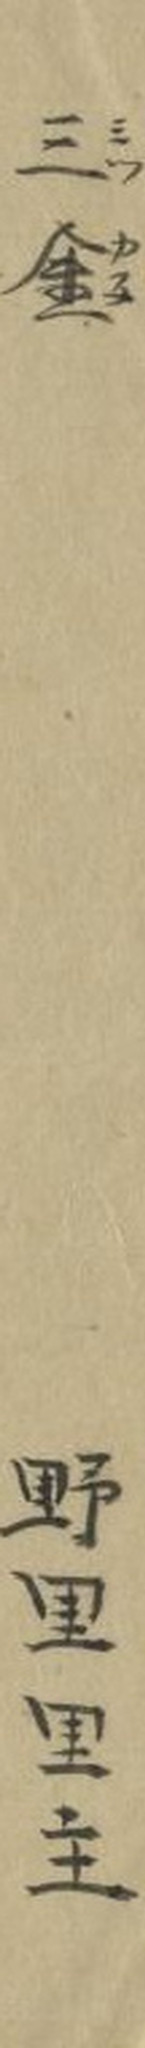三金野里里主
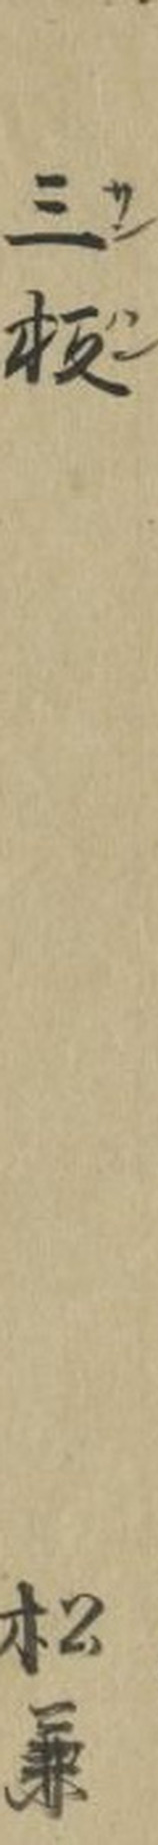三板松兼
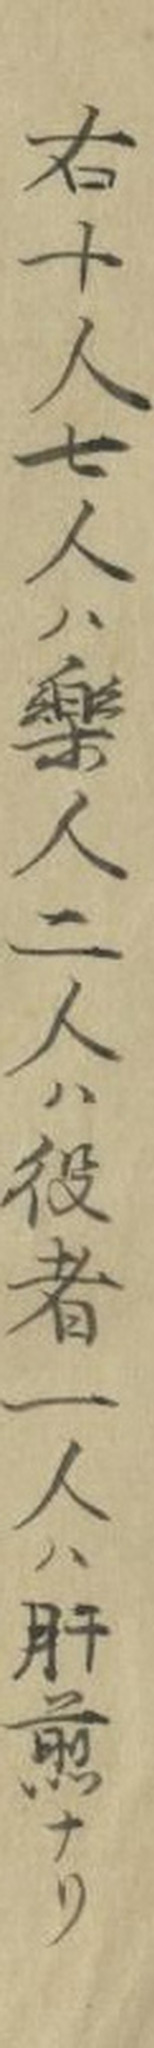右十人七人ハ楽人二人ハ役者一人ハ肝煎ナリ
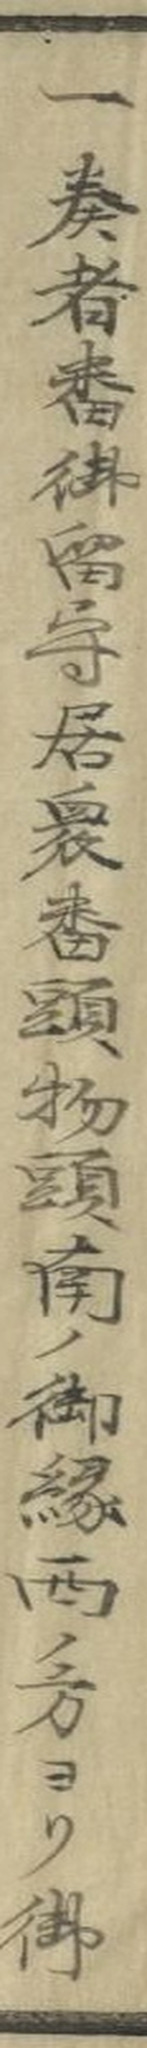一奏者番御留守居衆番頭物頭南ノ御縁西ノ方ヨリ御
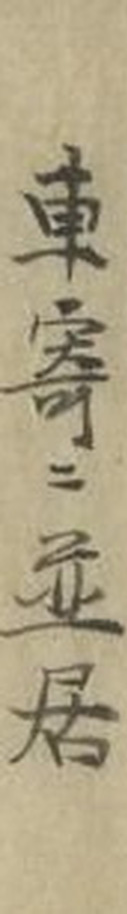東寄ニ並居
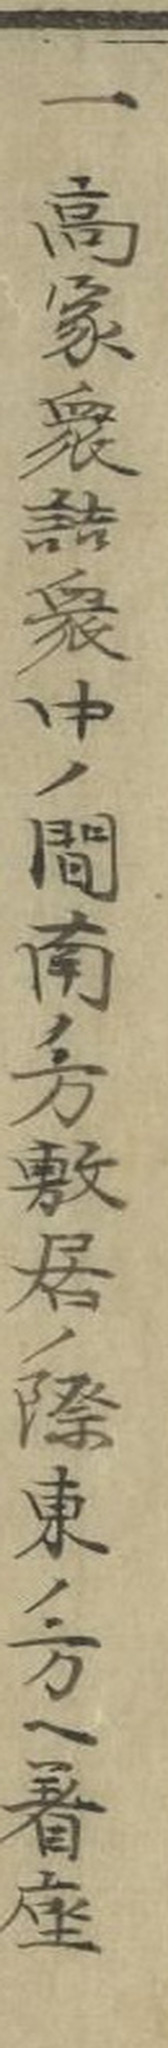一高家衆詰衆中ノ間南ノ方敷居ノ際東ノ方へ着座
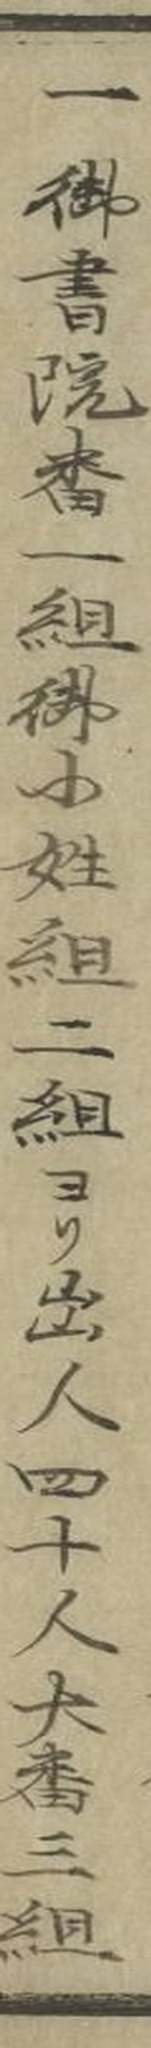一御書院番一組御小姓組ニ組ヨリ出人四十人大番三組
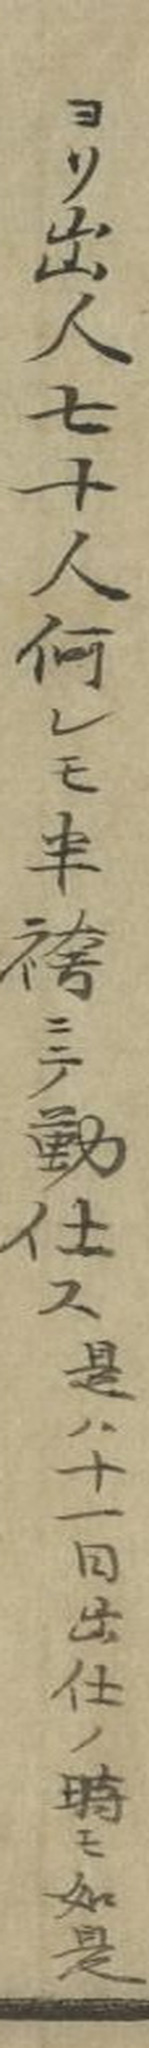ヨリ出人七十人何レモ半袴ニテ勤任ス是ハ十一日出仕ノ時モ如是
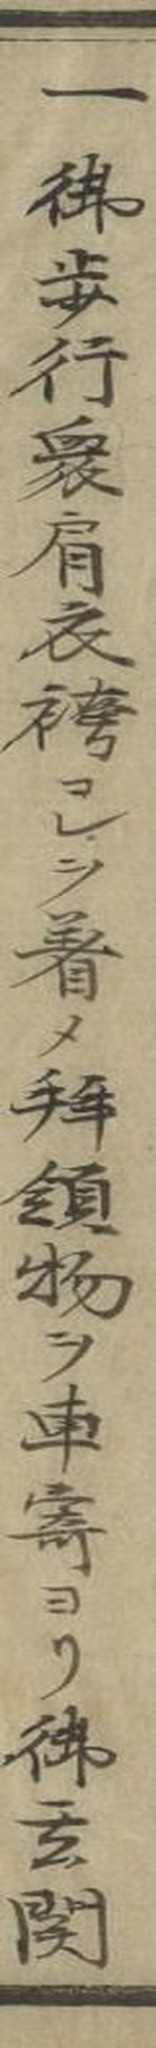一御歩行衆肩衣袴コレヲ着メ拝領物ヲ車寄ヨリ御玄関
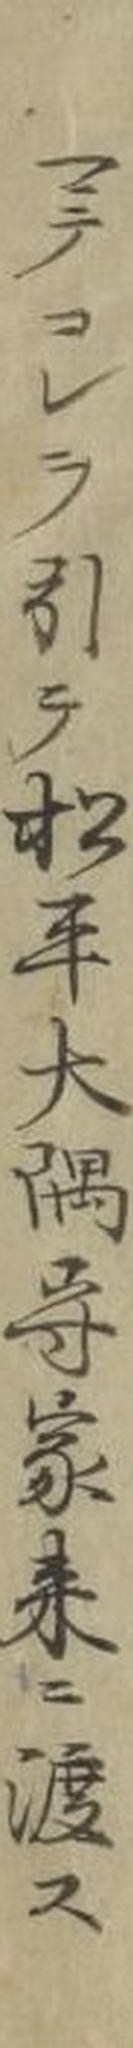マテコレラ引テ松平大隅守家来ニ渡ス
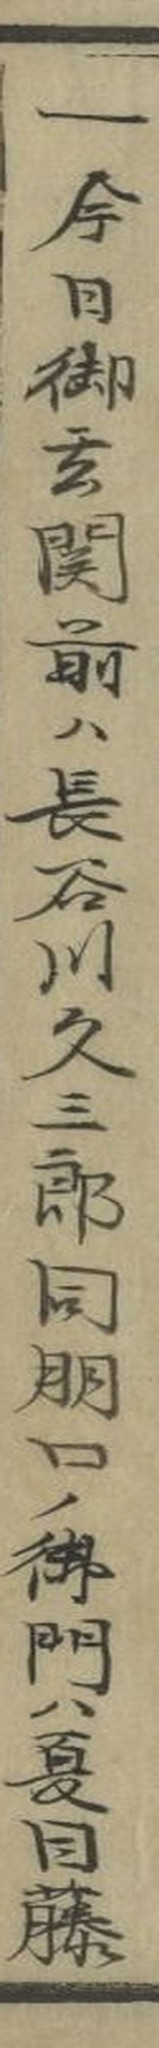一今日御玄関前ハ長谷川久三郎同朋口ノ御門ハ夏目藤

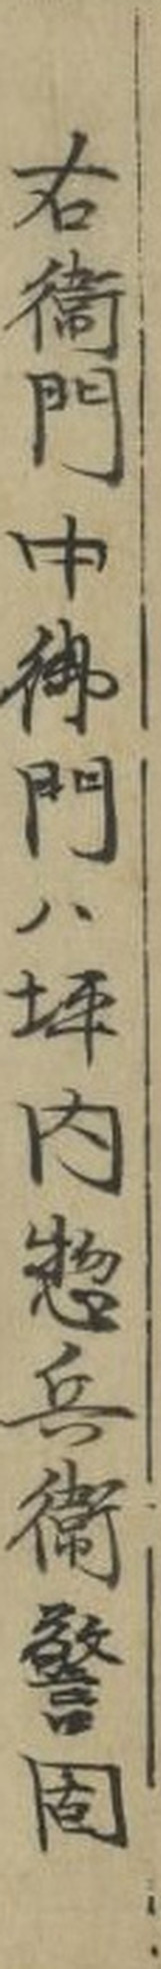右衛門中御門ハ坪内惣兵衛警固
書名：琉球往来（下）
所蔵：University of the Ryukyus Library
